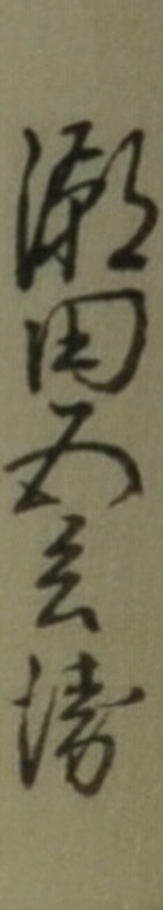潮田五兵衛
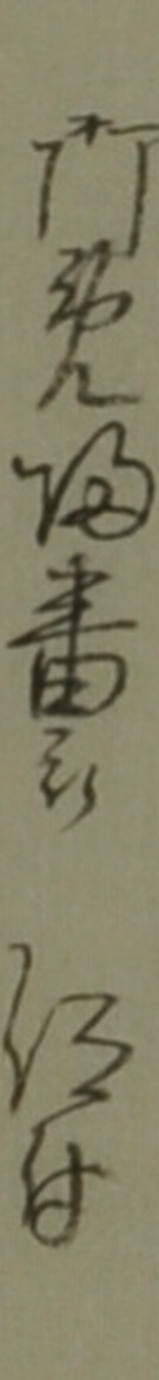御免帰番被仰付
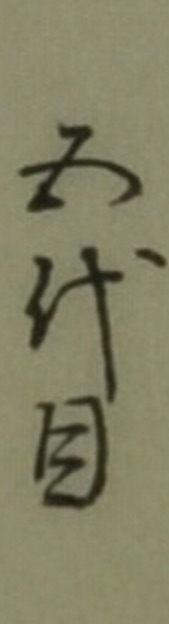五代目
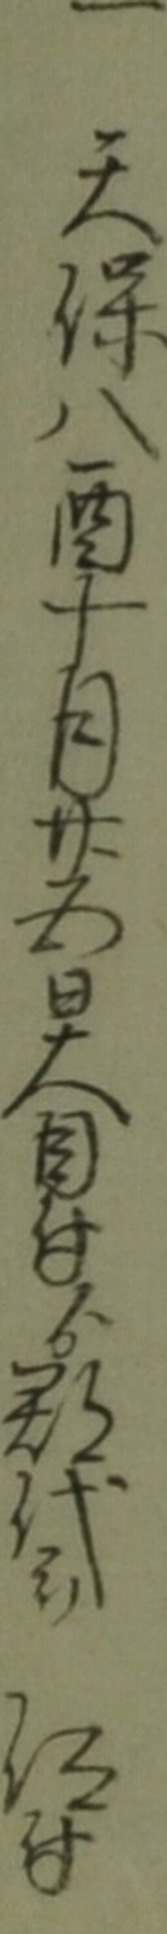一天保八酉十月廿五日大目付ゟ郡代被仰付
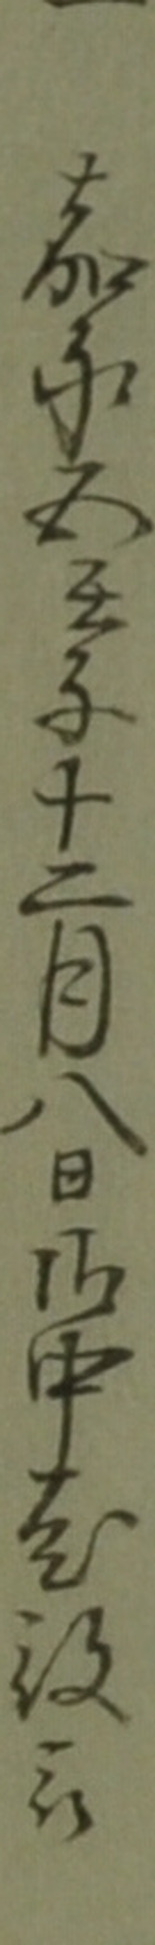一嘉永五壬子十二月八日御中老役被
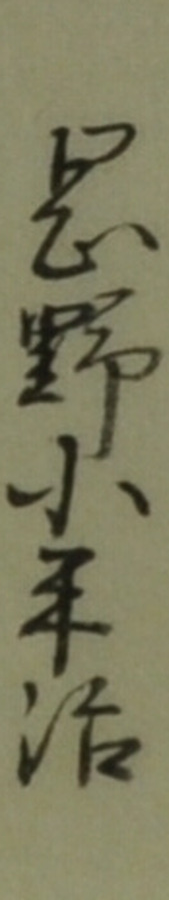岡野小平治
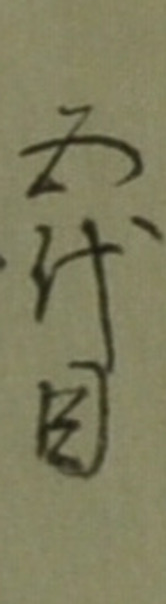五代目
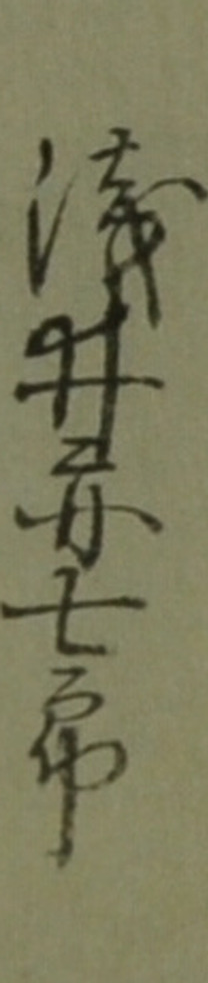浅井亦七郎
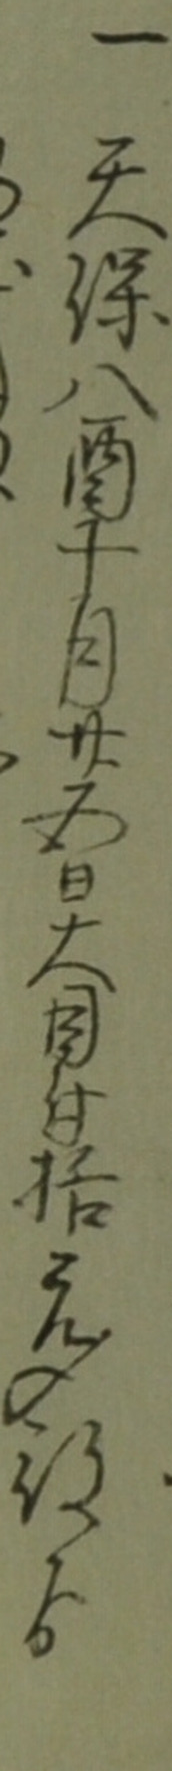一天保八酉十月廿五日大目付格元〆役ゟ
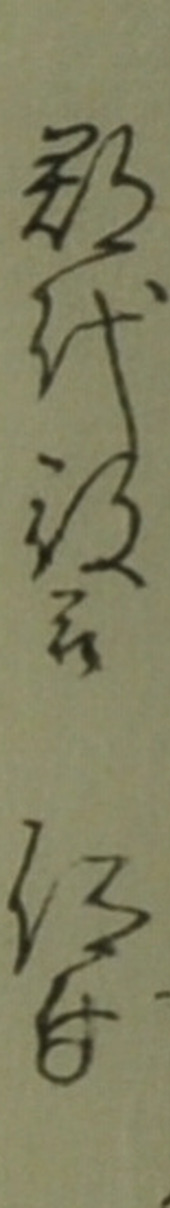郡代役被仰付

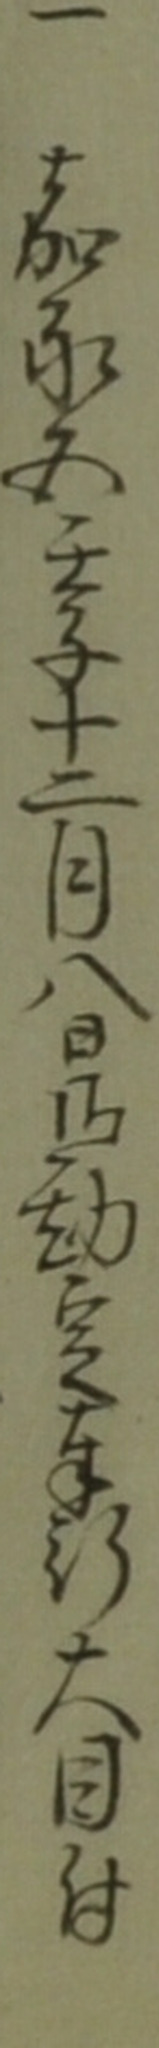一嘉永五壬子十二月八日御勘定奉行大目付
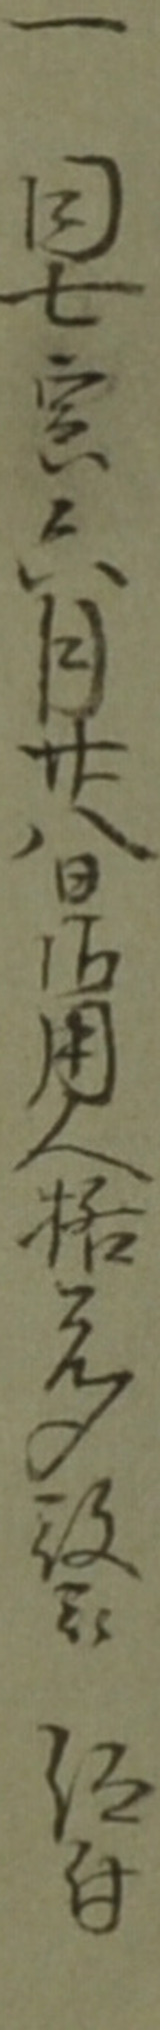一同七寅六月廿八日御用人格元〆役被仰付
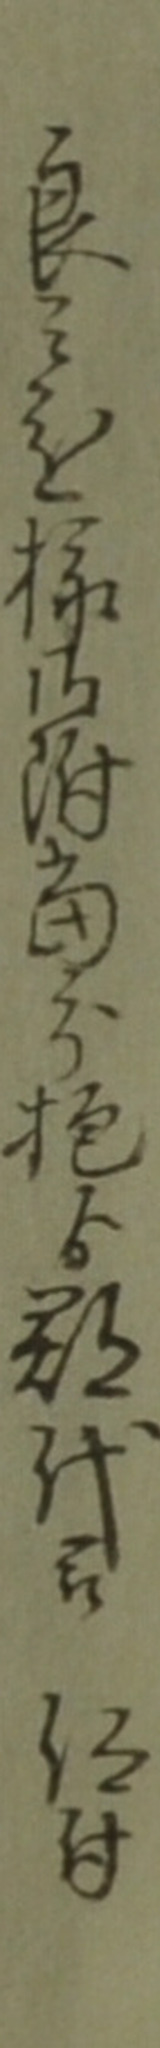良之進様御附当分抱ゟ郡代被仰付
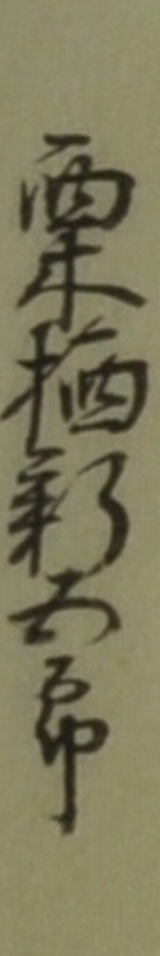栗栖新五郎
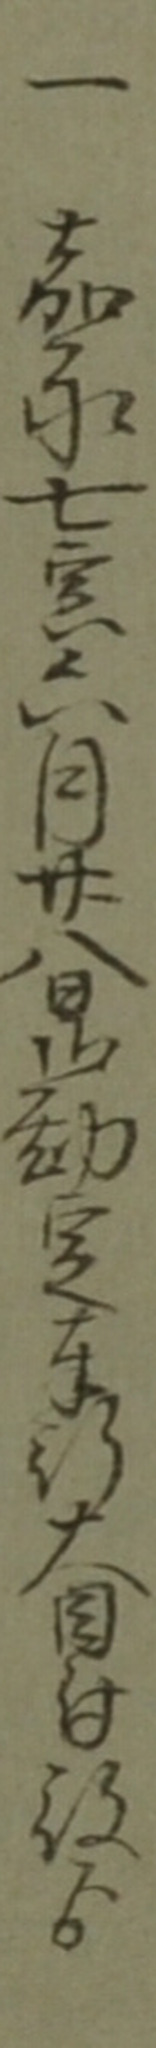一嘉永七寅六月廿八日御勘定奉行大目付役ゟ
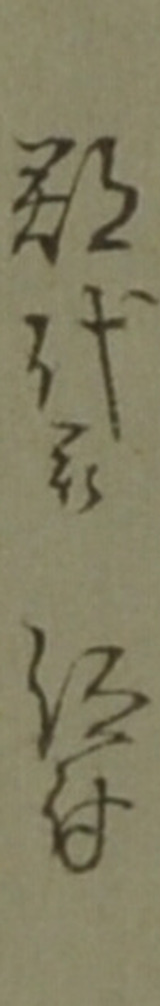郡代被仰付
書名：諸御役代々録（二）
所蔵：伊那市立高遠町図書館・合同会社AMANE
